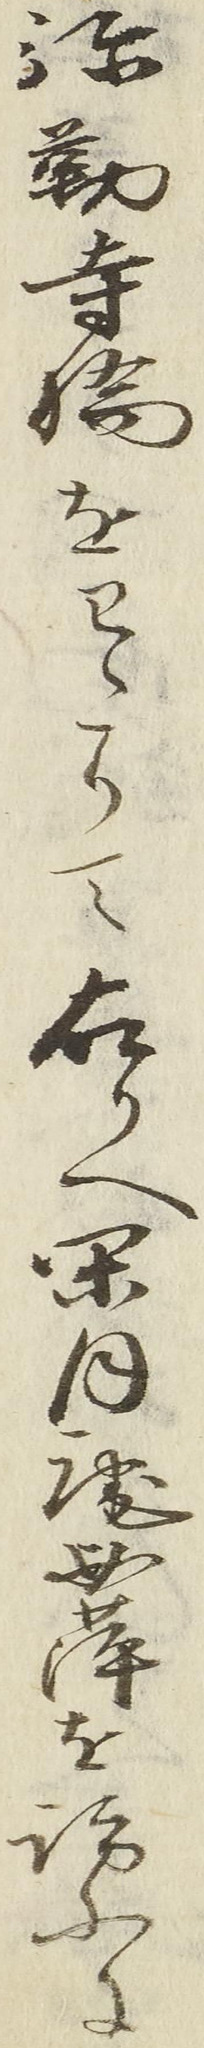弥勒寺橋をわたりて右りへ閑月庵如萍を訪ふに
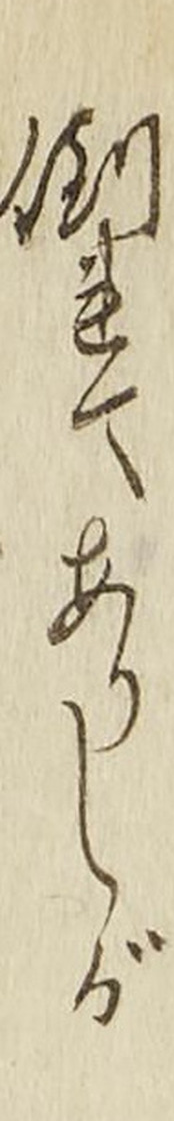倒れてありしが
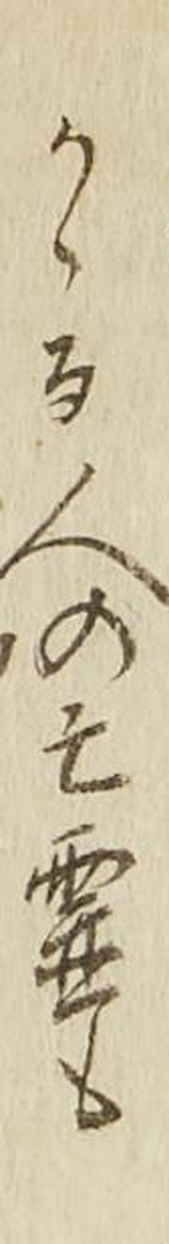かゝる人の亡霊も
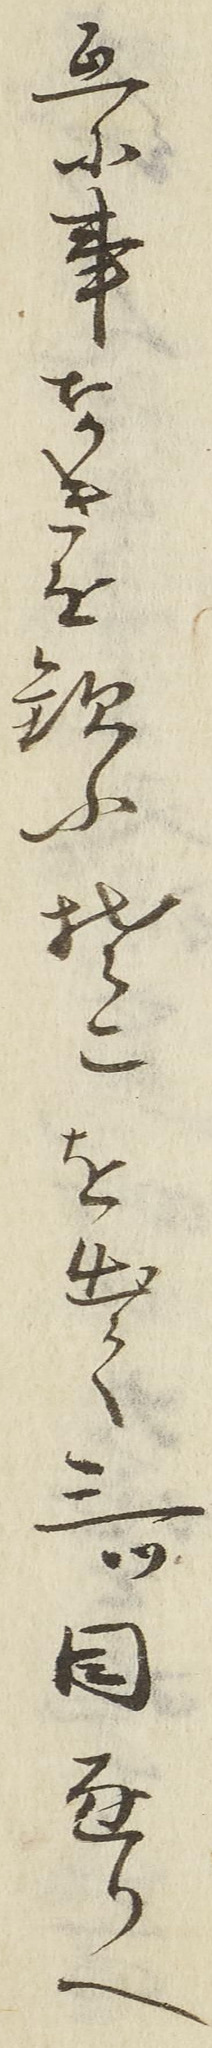互に事なきを歓ふそこを出て三ツ目通りへ
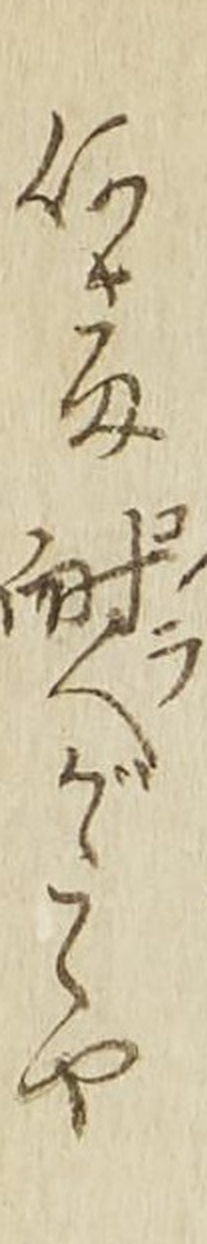何さま耐へがたくや

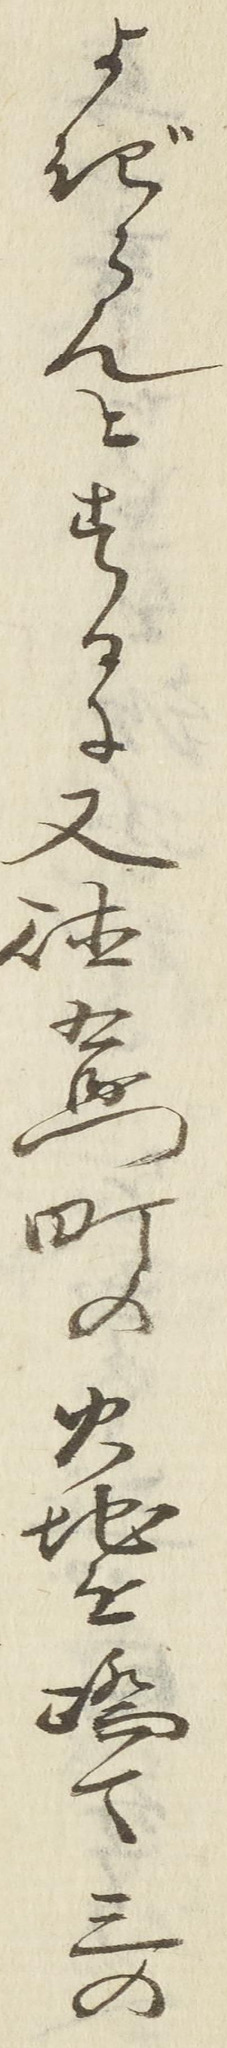よぎらんとするに又徳右衛門町の火地を踏て三の
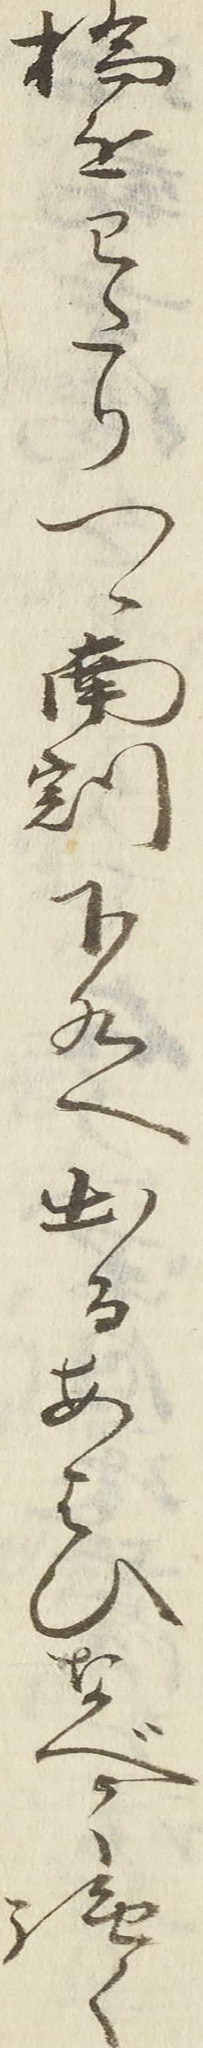橋をわたりつゝ南割下水へ出るあはひなべて強く
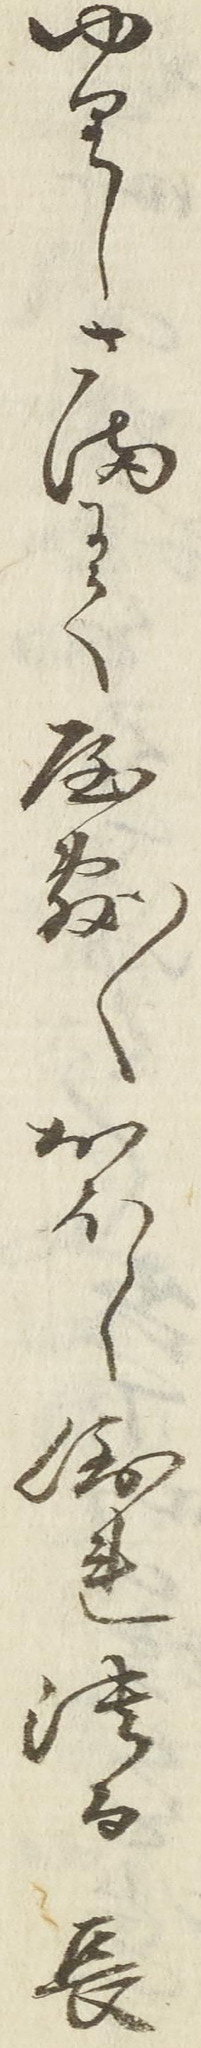ゆりしさまにて屋敷〳〵おほく倒れ潰る長
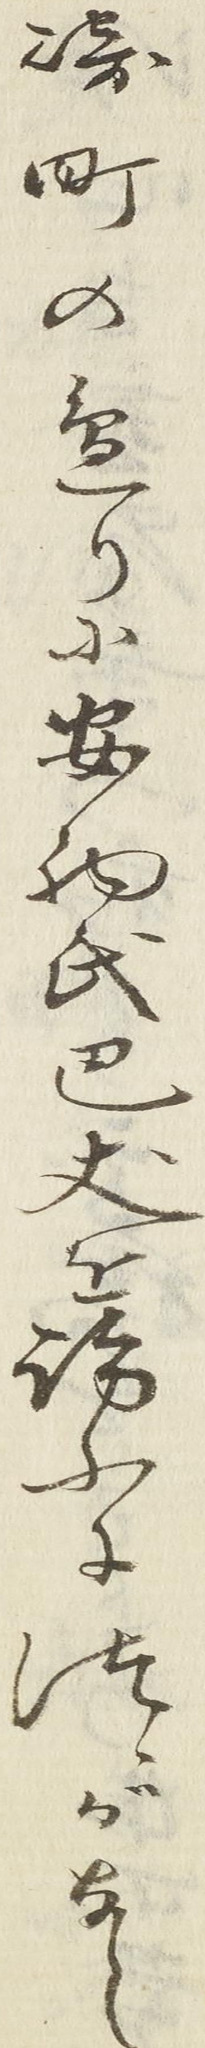崎町の辺りに安西氏巴丈を訪ふにつゝがなし
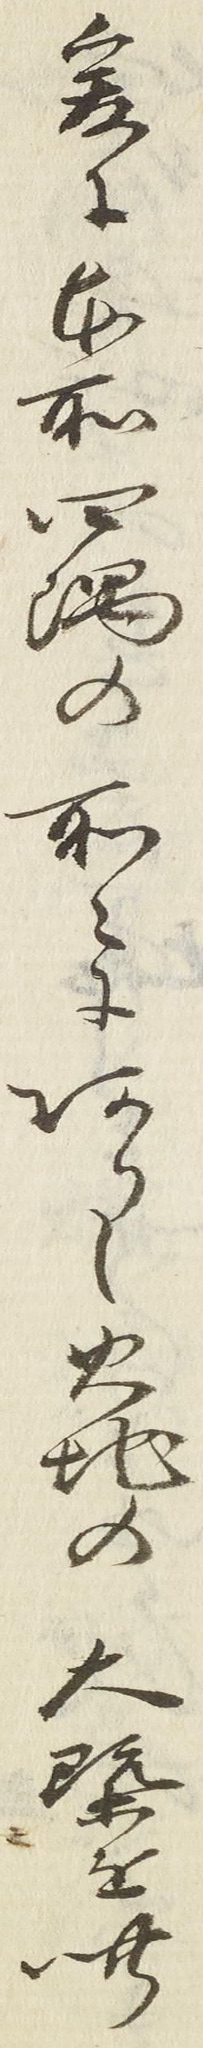爰に本所四隅の所〻にありし火地の大概を聞
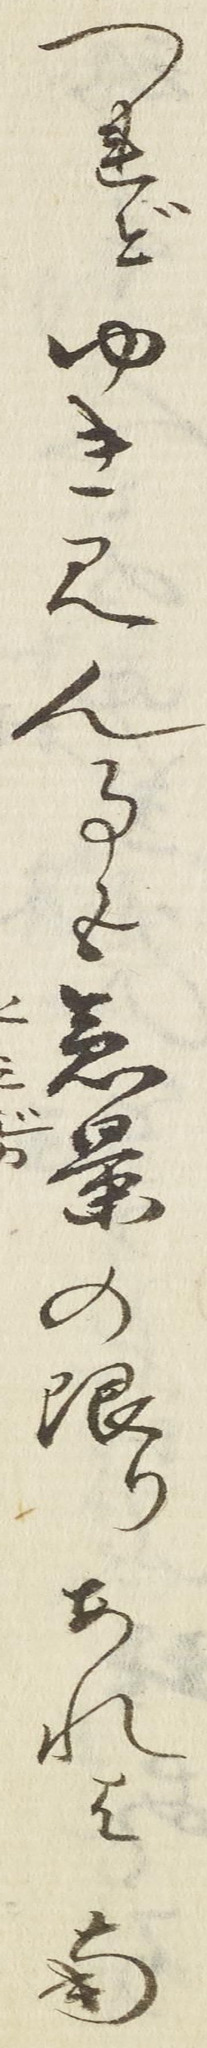つれどゆき見ん事も急景の限りあれは南
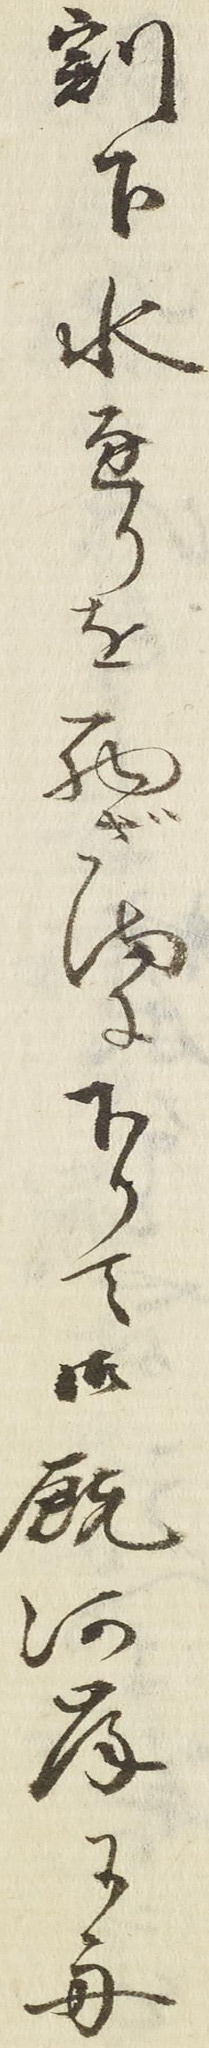割下水通りを西ざまに下りて御厩河岸に舟
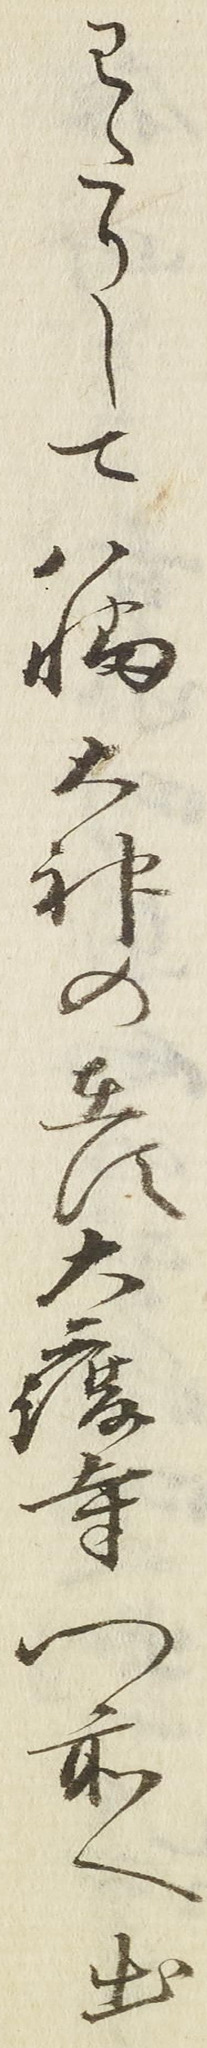わたりして八幡大神の在す大護寺門前へ出
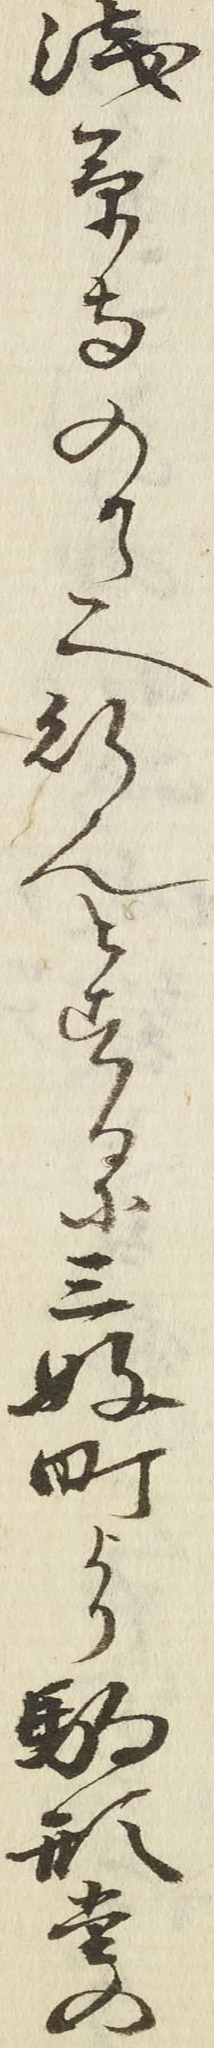浅草寺のかたへ行んとするに三好町より駒形堂の
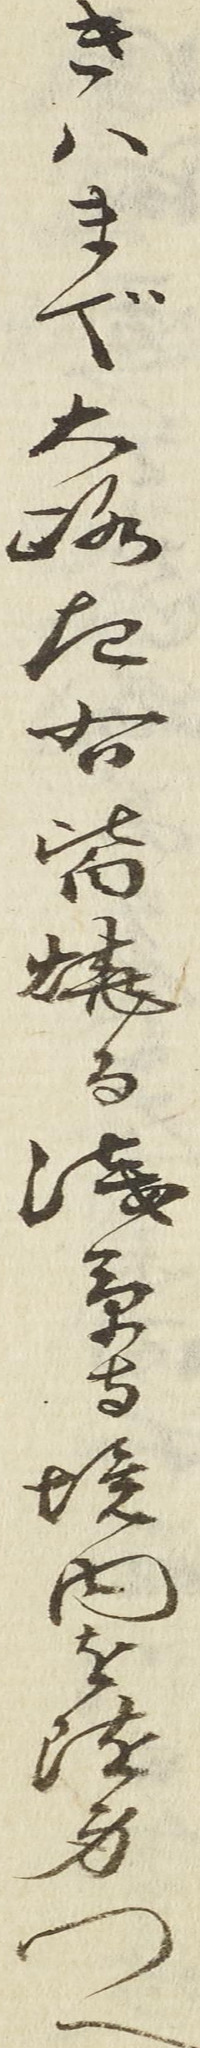きはまで大路左右皆焼る浅草寺境内を随身門へ
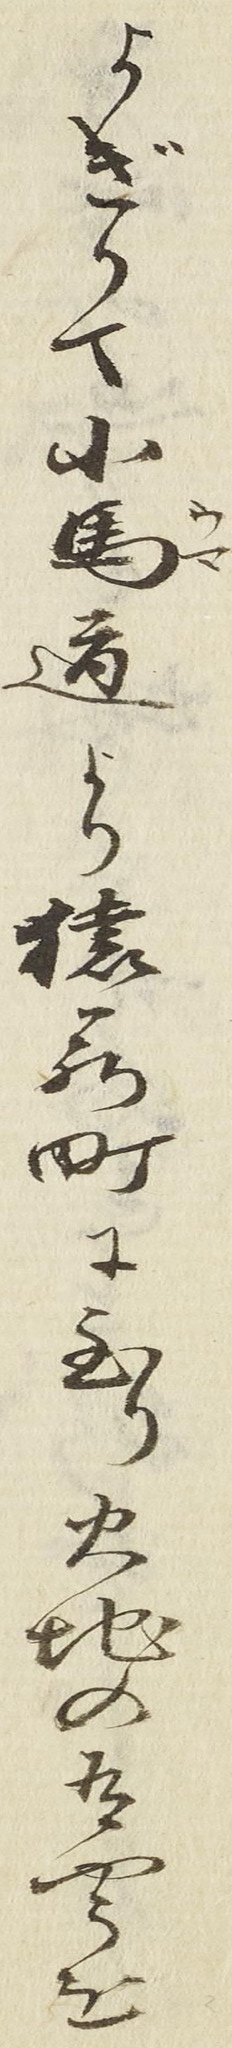よぎりて小馬道より猿若町に至り火地の有やうを
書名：やぶれ窓の記　全
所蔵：東京大学地震研究所図書室 Earthquake Research Institute Library, The University of Tokyo, JAPAN
